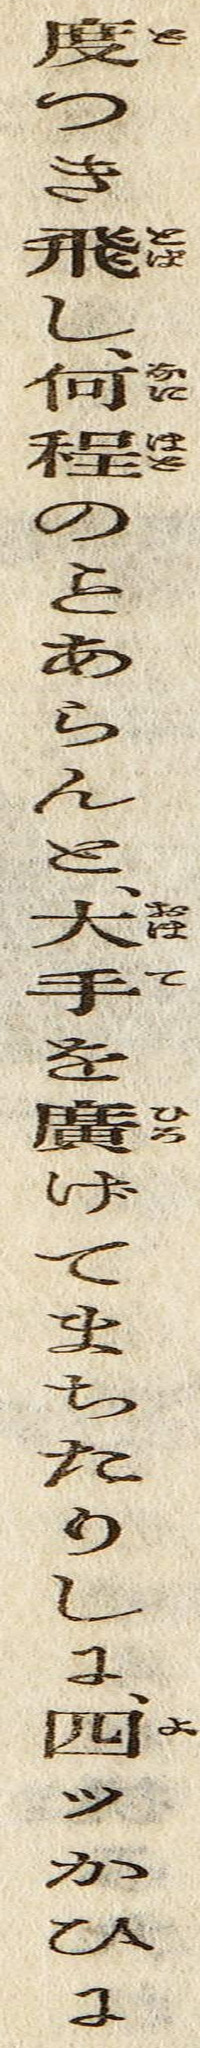度つき飛し、何程のことあらんと、大手を広げてまちたりしに、四ツかひに
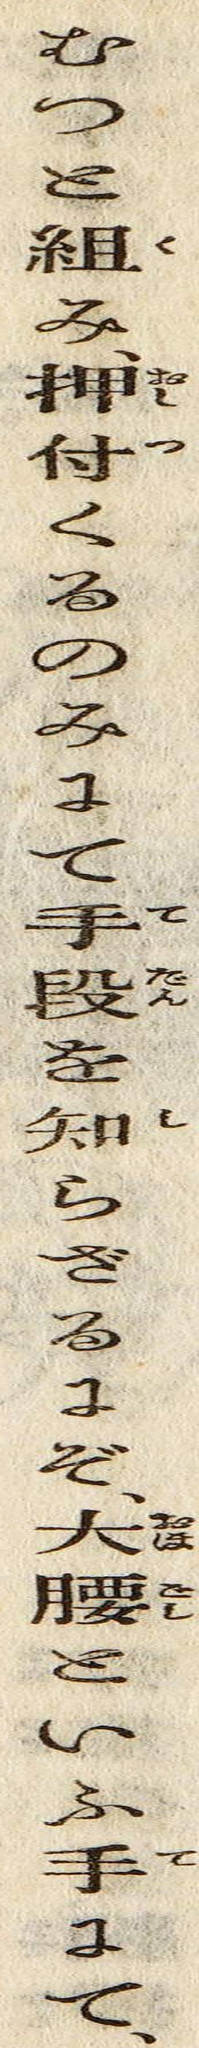むつと組み、押付くるのみにて手段を知らざるにぞ、大腰といふ手にて、
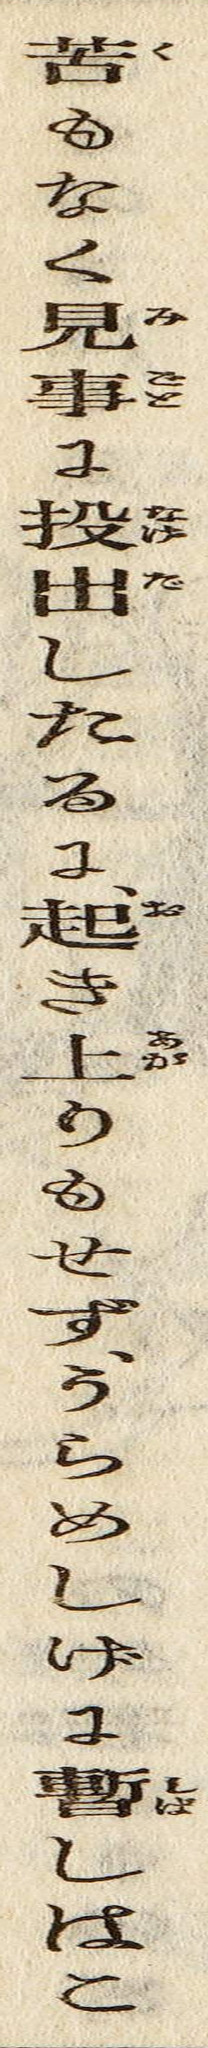苦もなく見事に投出したるに、起き上りもせず、うらめしげに暫しはこ
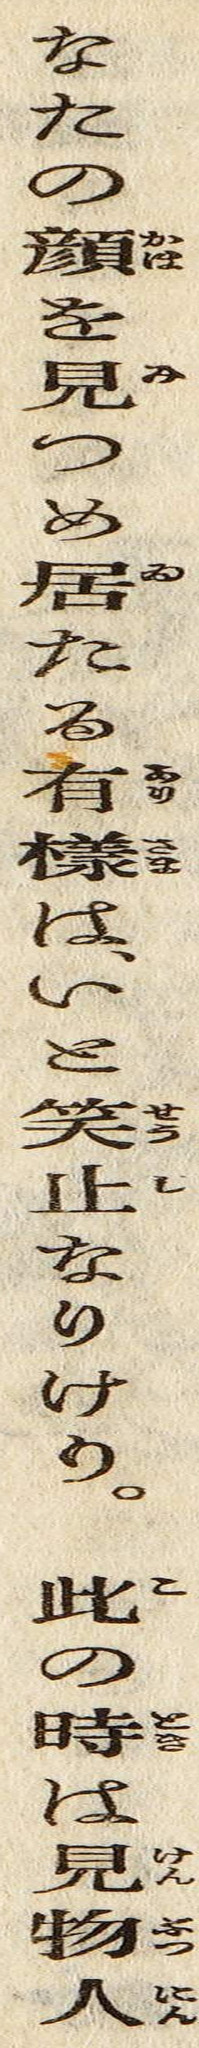なたの顔を見つめ居たる有様は、いと笑止なりけり。此の時は見物人
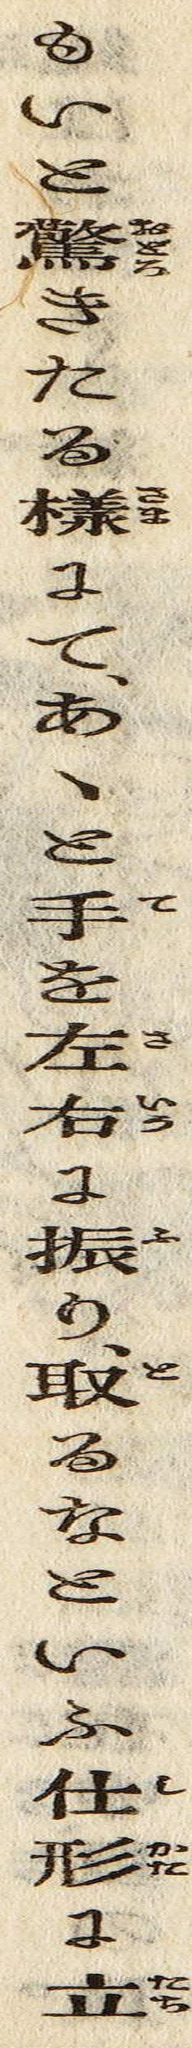もいと驚きたる様にて、あヽと手を左右に振り、取るなといふ仕形に立
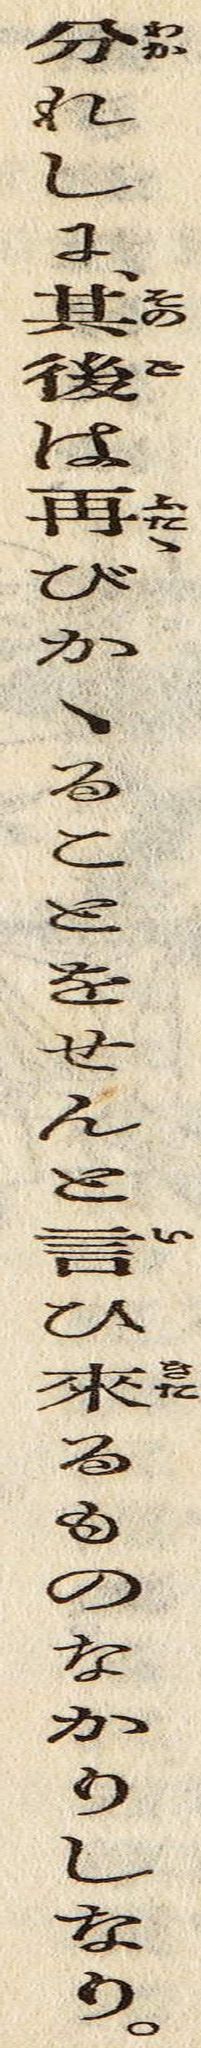分れしに、其後は再びかヽることをせんと言ひ来るものなかりしなり。
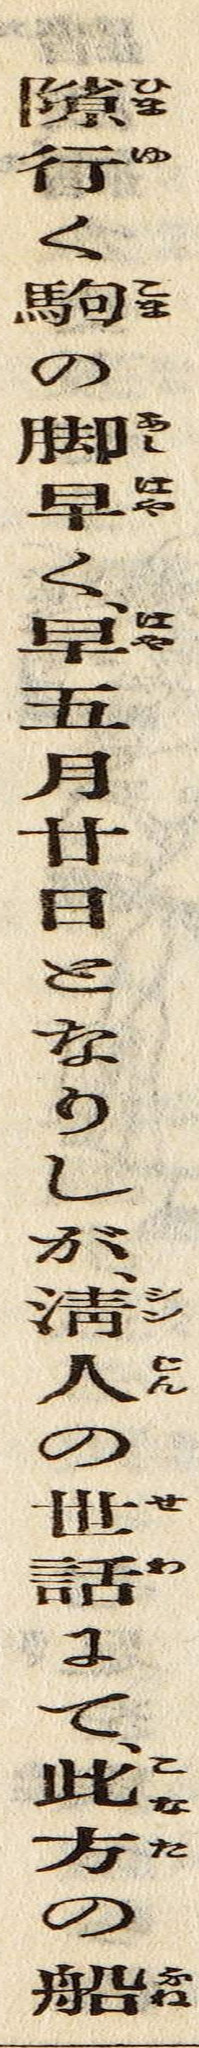隙行く駒の脚早く、早五月廿日となりしが、清人の世話にて、此方の船
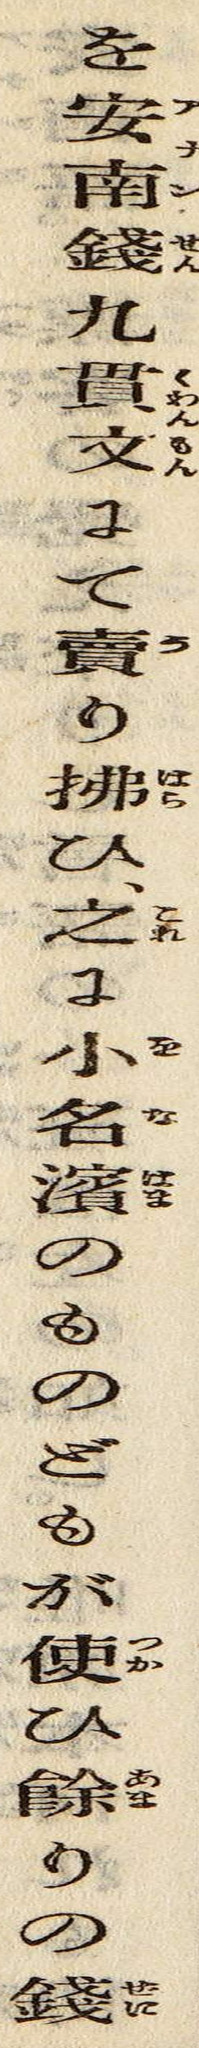を安南銭九貫文にて売り払ひ、之に小名浜のものどもが使ひ余りの銭
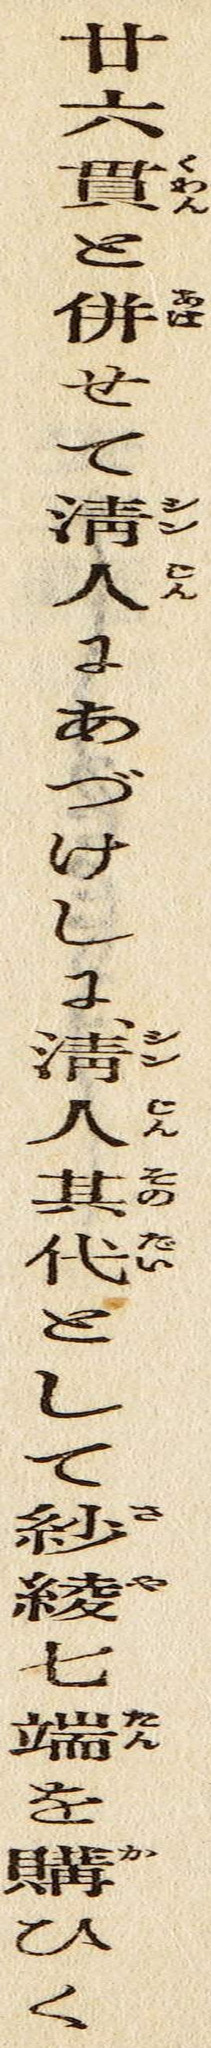廿六貫と併せて清人にあづけしに、清人其代として紗綾七端を購ひく
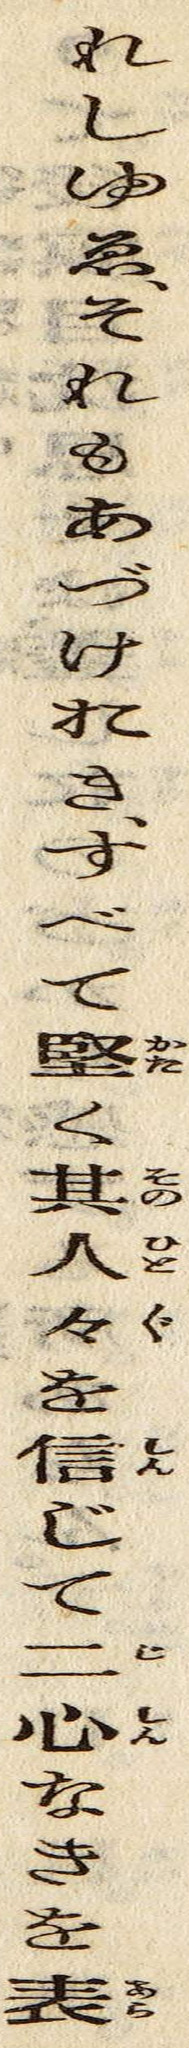れしゆゑ、それもあづけおき、すべて堅く其人々を信じて二心なきを表
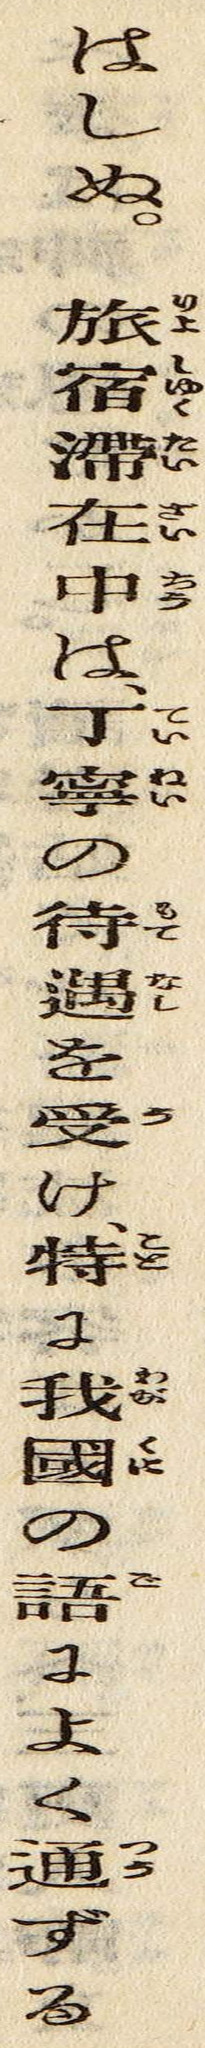はしぬ。旅宿滞在中は、丁寧の待遇を受け、特に我国の語によく通ずる
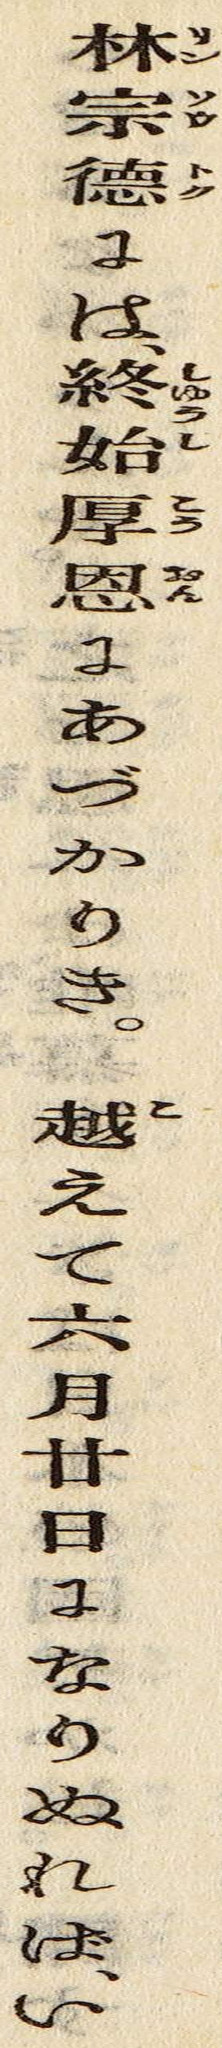林宗徳には、終始厚恩にあづかりき。越えて六月廿日になりぬれば、い
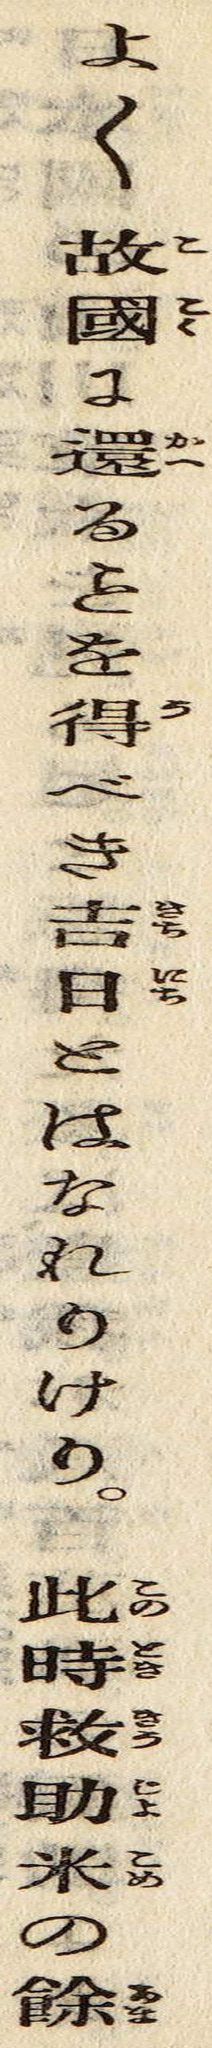よ〳〵故国に還ることを得べき吉日とはなれりけり。此時救助米の余
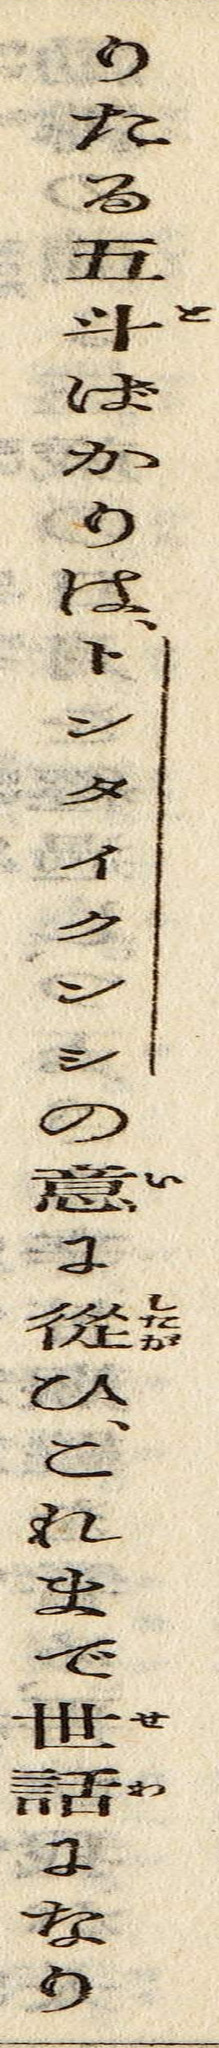りたる五斗ばかりは、トンタイクンシの意に従ひ、これまで世話になり
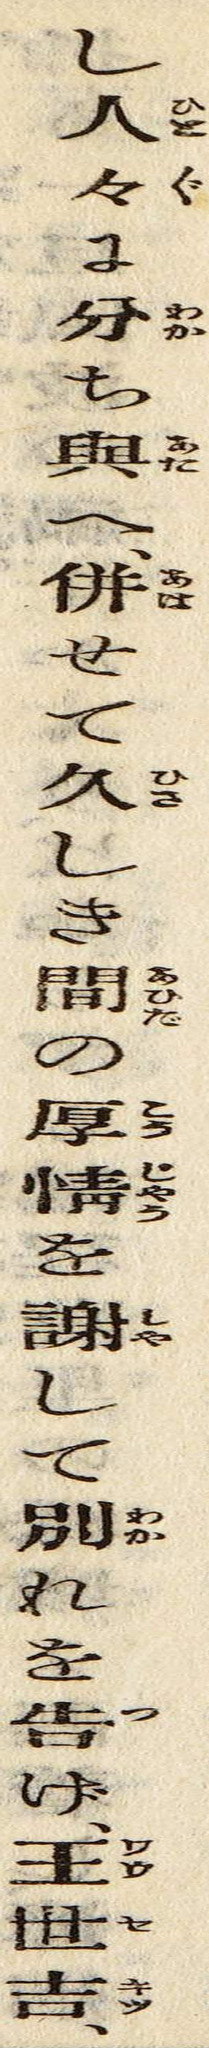し人々に分ち与へ、併せて久しき間の厚情を謝して別れを告げ、王世吉、
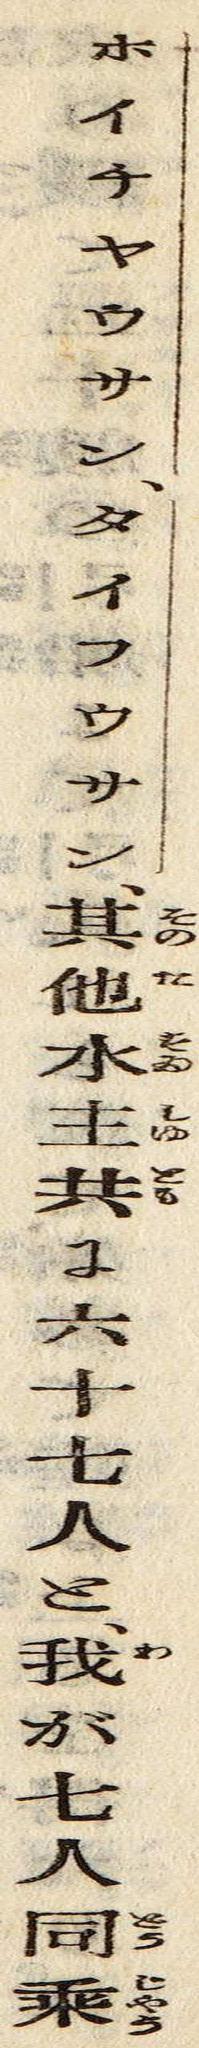ホイチヤウサン、タイフウサン、其他水主共に六十七人と、我が七人同乗
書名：日本漂流譚
